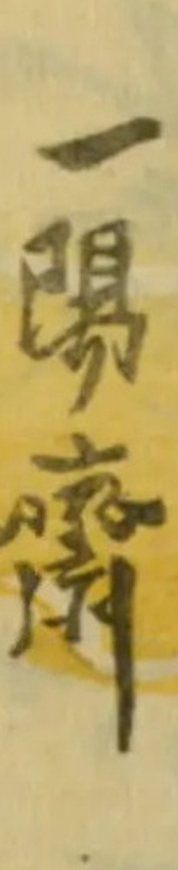一陽斎
